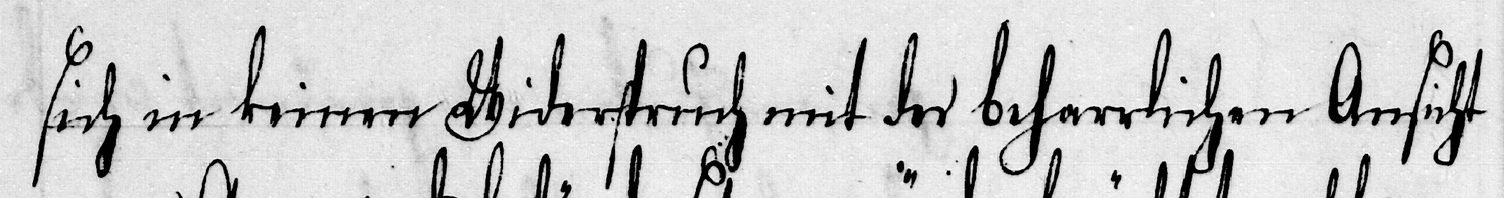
sich in keinen Widerspruch mit der beharrlichen Ansicht
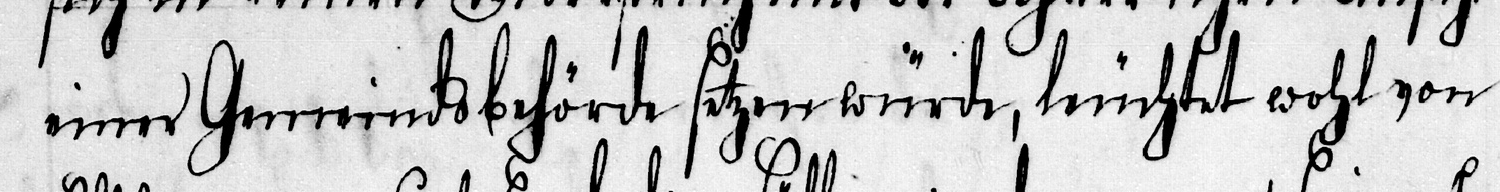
einer Gemeindsbehörde setzen würde, leuchtet wohl von
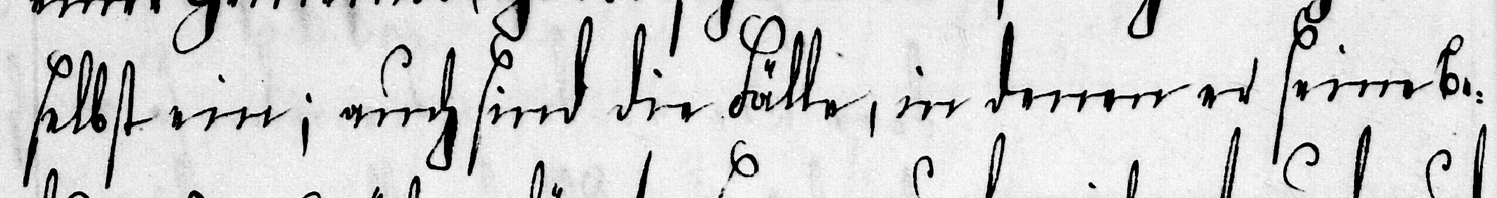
selbst ein; auch sind die Fälle, in denen er seine Be¬
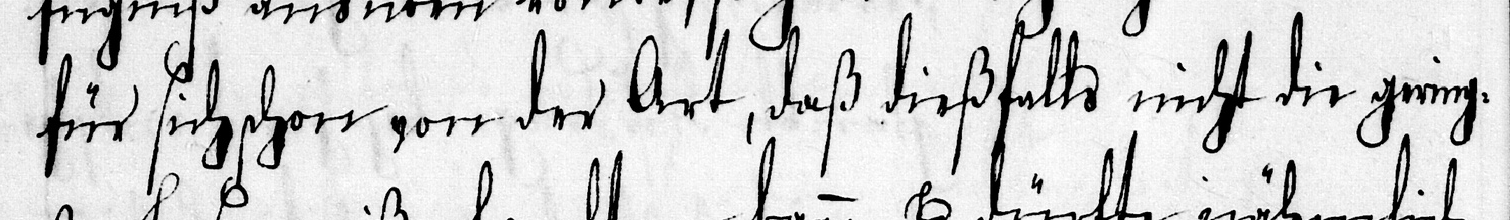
für sich schon von der Art, daß dießfalls nicht die gerin¬
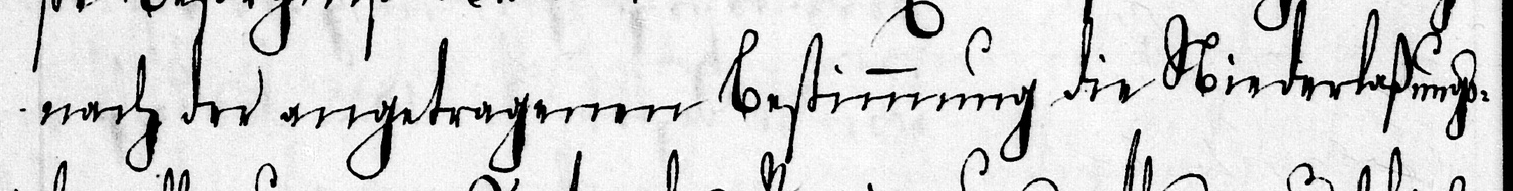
nach der angetragenen Bestimmung die Niederlaßungs¬
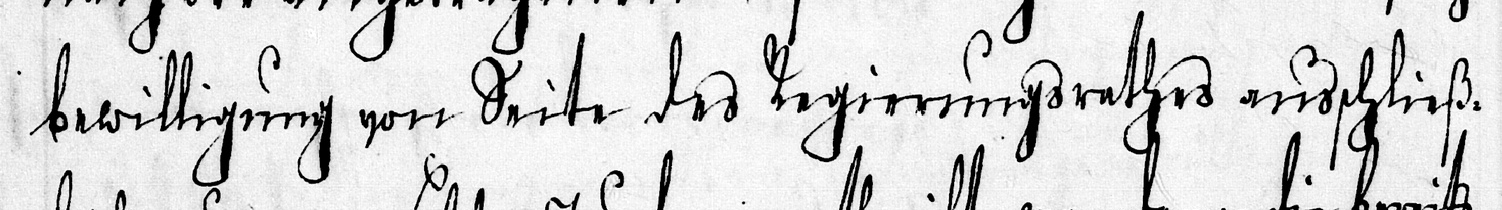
bewilligung von Seite der Regierungsrathes ausschließ¬
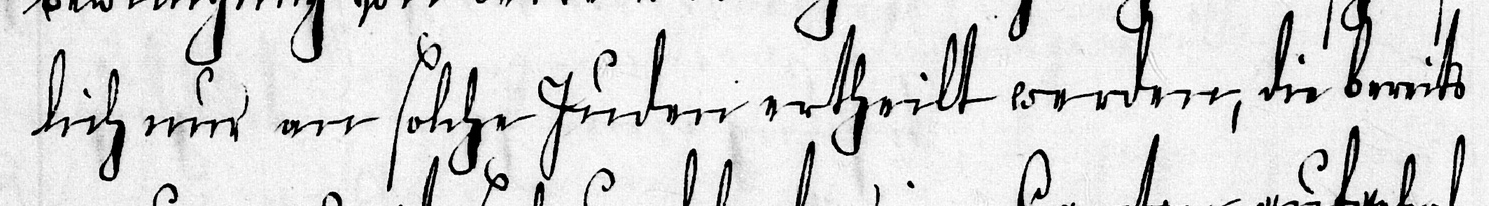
lich nur an solche Juden ertheilt werden, die bereits
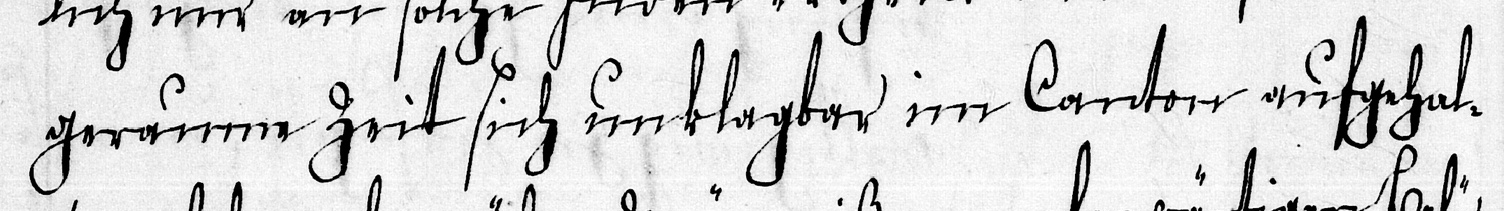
geraume Zeit sich unklagbar im Canton aufgehal¬
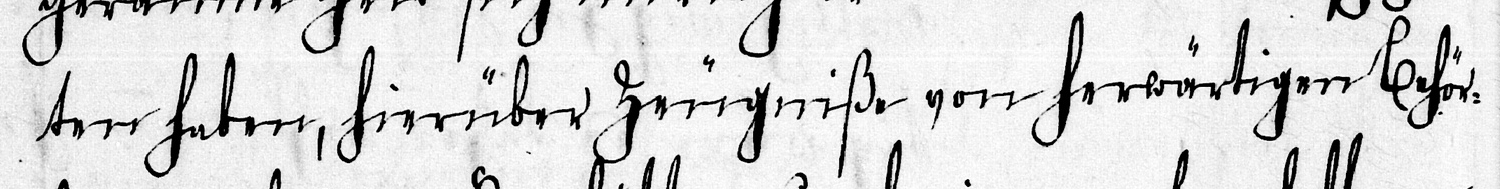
ten haben, hierüber Zeugniße von herwärtigen Behör¬
